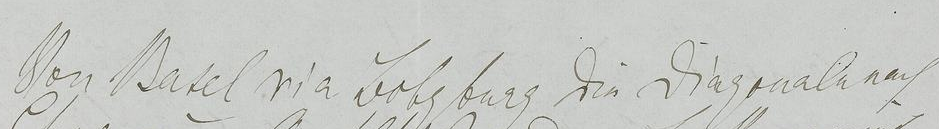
Von Basel via Bötzberg die Diagonale nach
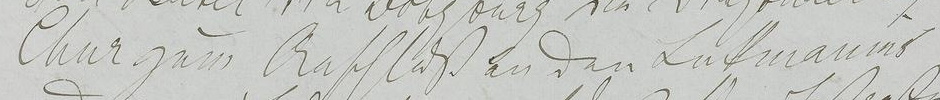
Chur zum Anschluß an den Lukmanier
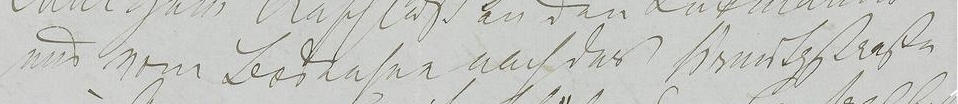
und vom Bodensee nach der Kreutzstraße
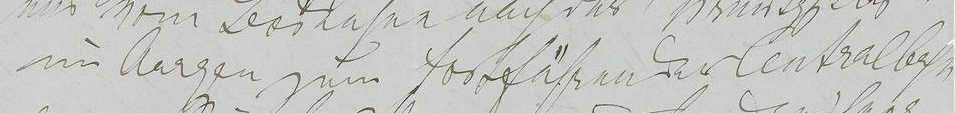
im Aargau zum Fortführen der Centralbahn-
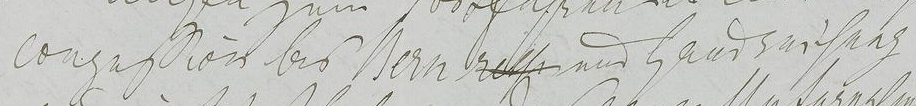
conzession bis Bern...und Handreichung
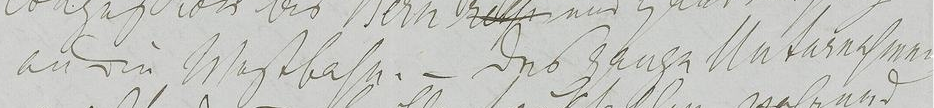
an die Westbahn. – Das ganze Unternehmen
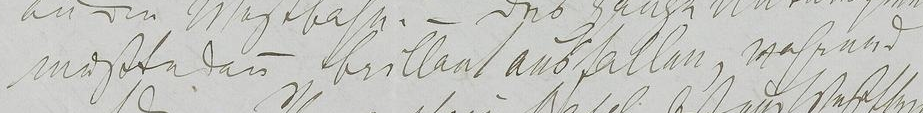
müßte dann brillant ausfallen, während
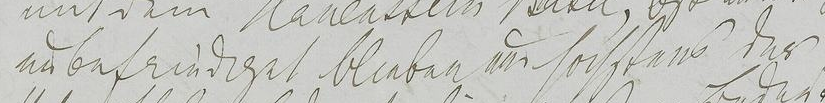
unbefriediget blieben und höchstens der
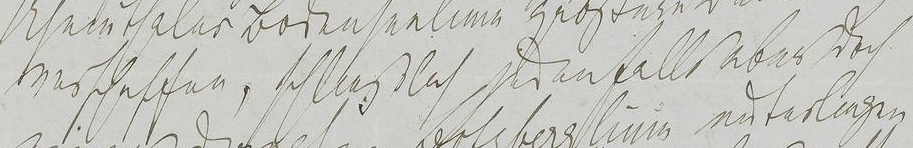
verschaffen, schließlich jedenfalls aber doch
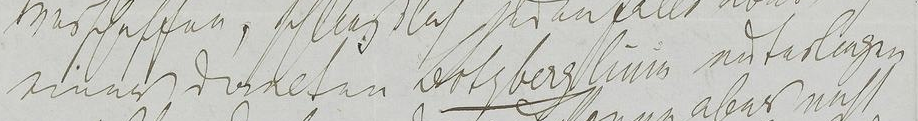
einer directen Bötzberglinie unterliegen
